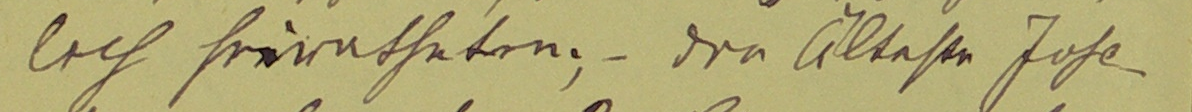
lich heiratheten;- Die älteste Jose¬
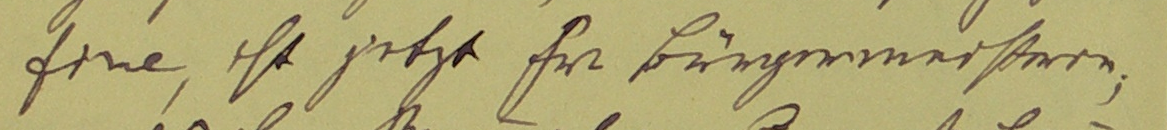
fine, ist jetzt Fr. Bürgermeisterin
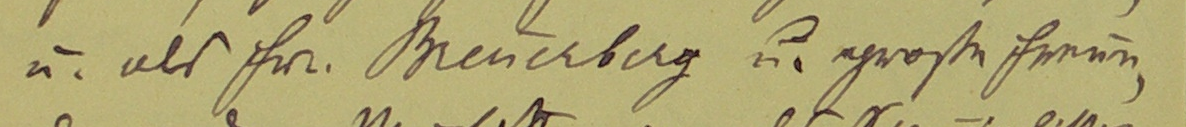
als Fr. Brennerberg und große Herrin
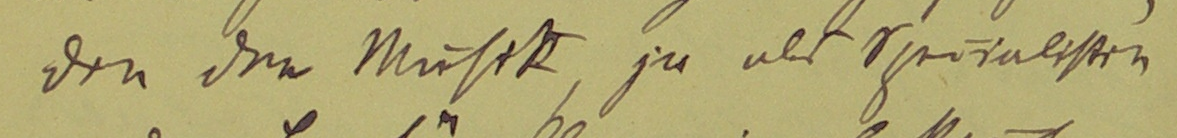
von der Musik, ja als Spezialistin
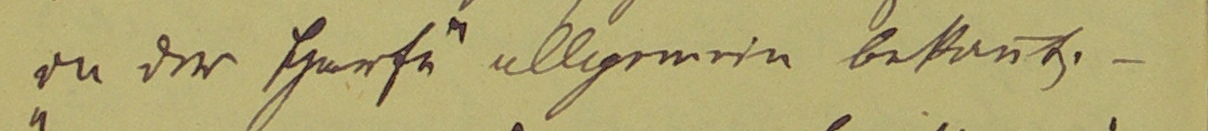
an der „Harfe“ allgemein bekannt.-
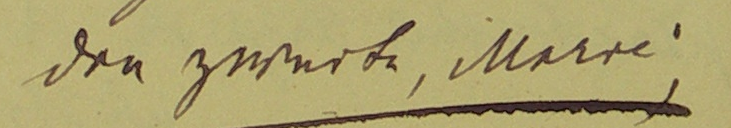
die zweite Marie
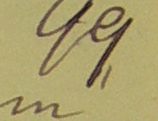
99
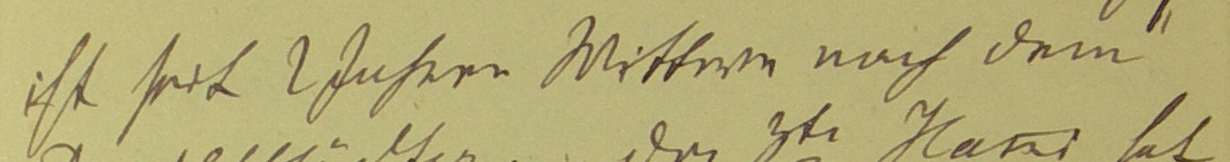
ist seit 2 Jahren Wittwe nach dem
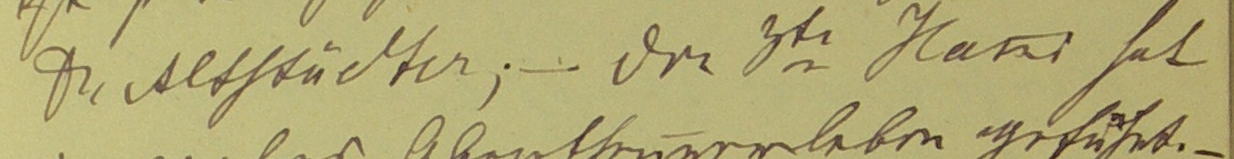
Dr. Altstädter;- Die 3-te Hanni hat
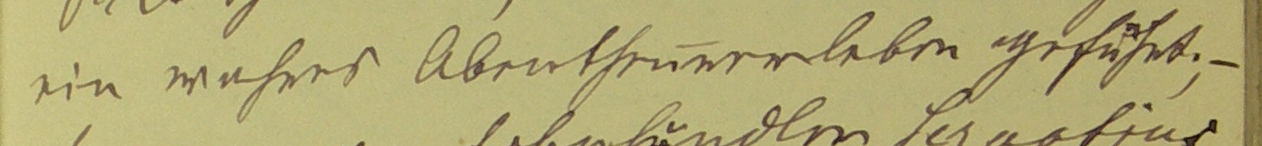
ein wahres Abentheuerleben geführt,-
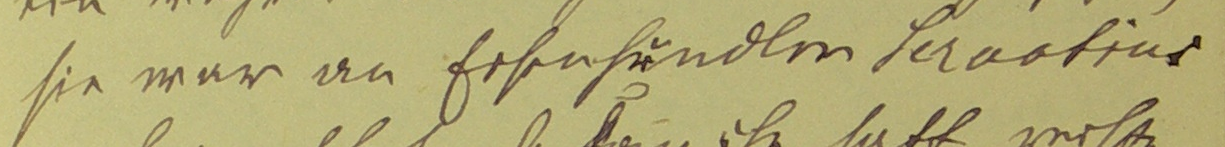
sie war an Eisenhändler Servatius
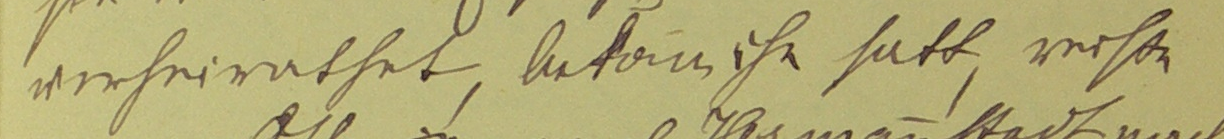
verheiratet, bekam ihn satt, reiste
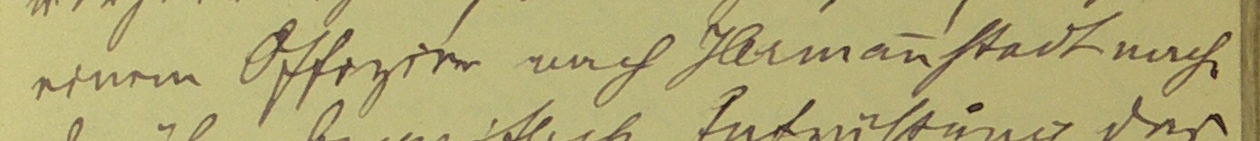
einem Offizier nach Hermanstadt nach
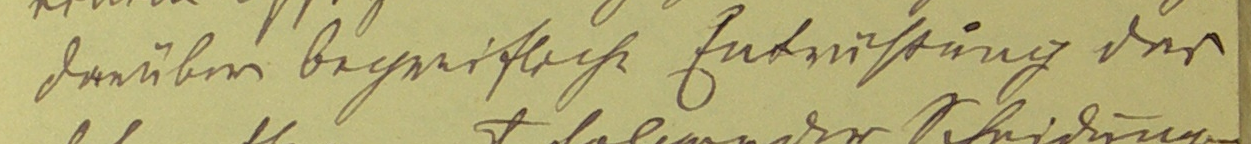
darüber begreifliche Entrüstung des
